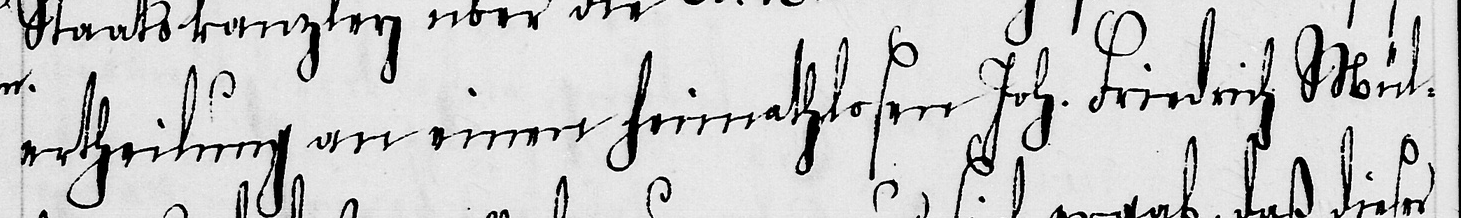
ertheilung an einen heimathlosen Joh. Friedrich Mül¬
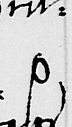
ße
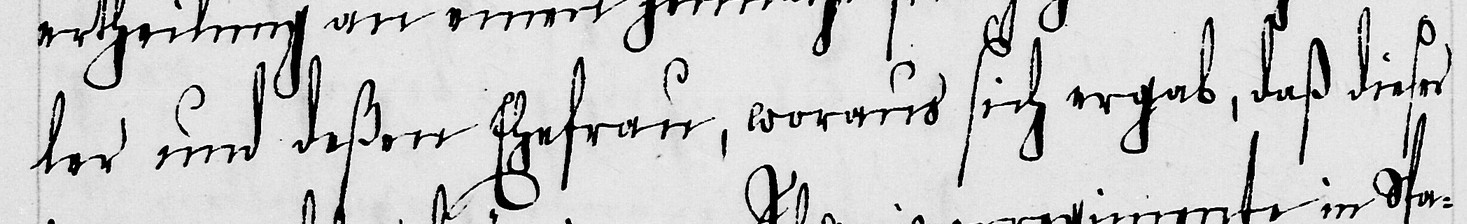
ler und deßen Ehefrau, woraus sich ergab, daß dieser
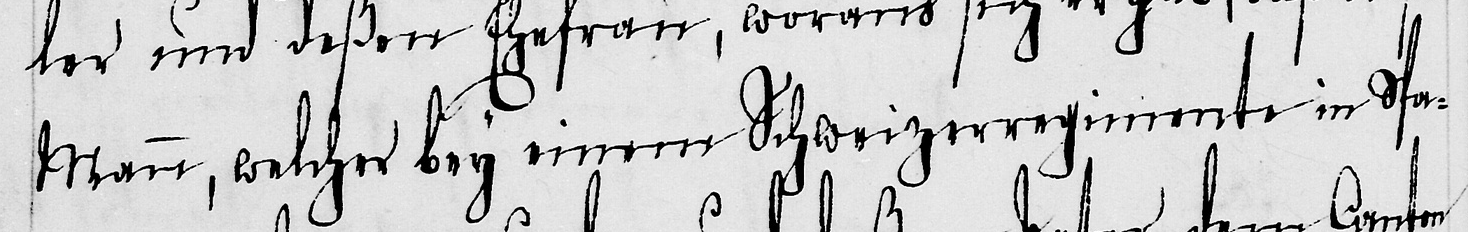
Mann, welcher bey einem Schweizerregimente in Spa¬
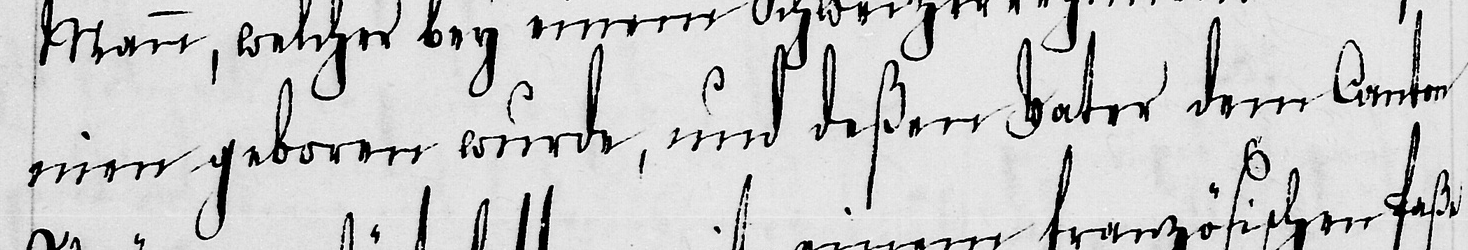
nien geboren wurde, und deßen Vater dem Canton
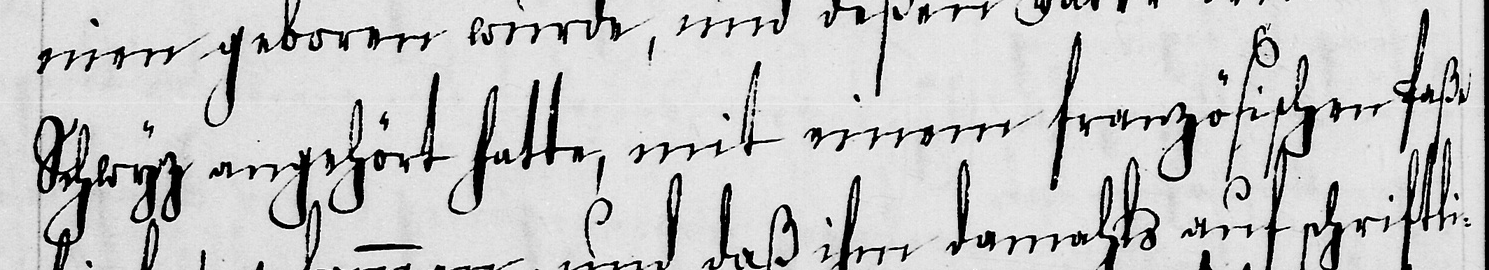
Schwyz angehört hatte, mit einem französischen Pa¬
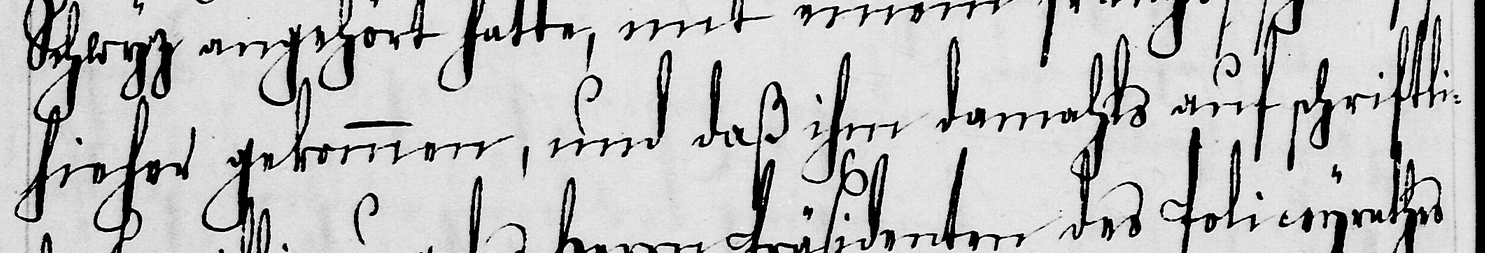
hieher gekommen, und das ihm damahls auf schriftl¬
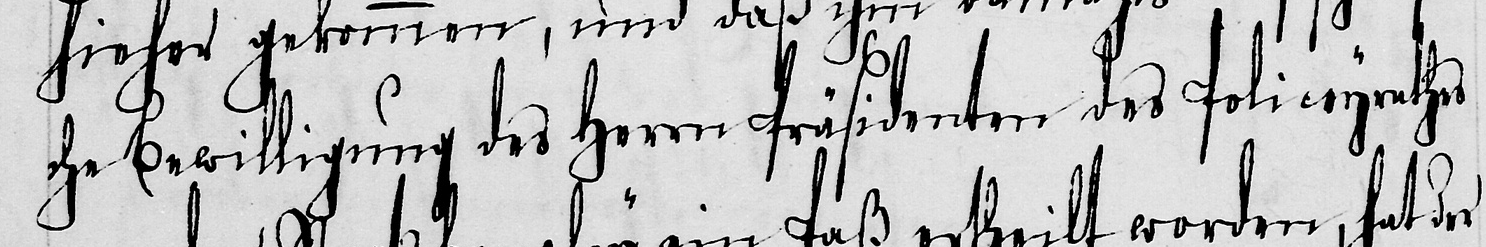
iche Bewilligung des Herrn Präsidenten des Policeyrathes
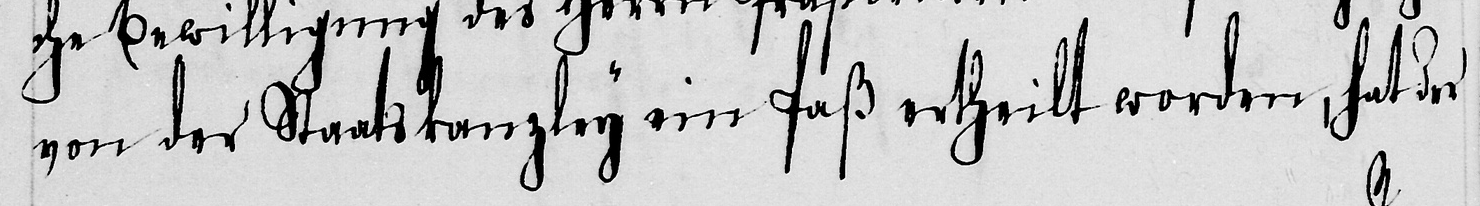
von der Staatskanzley ein Paß erhteilt worden, hat d¬
